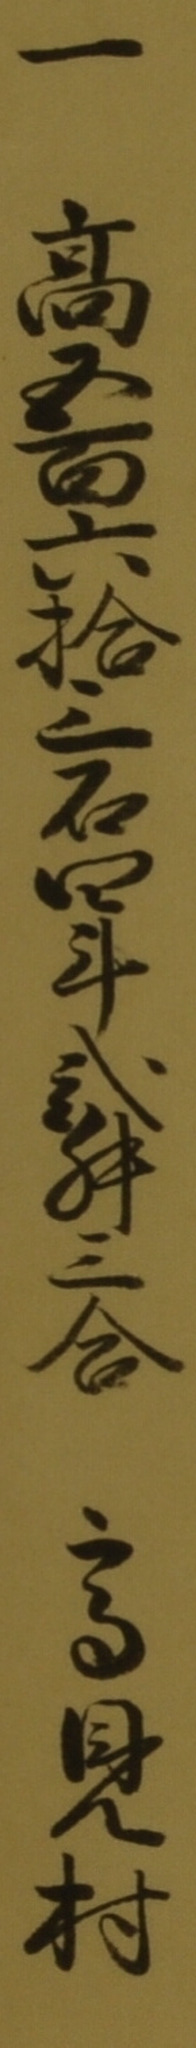一高五百六拾三石四斗弐升三合高見村
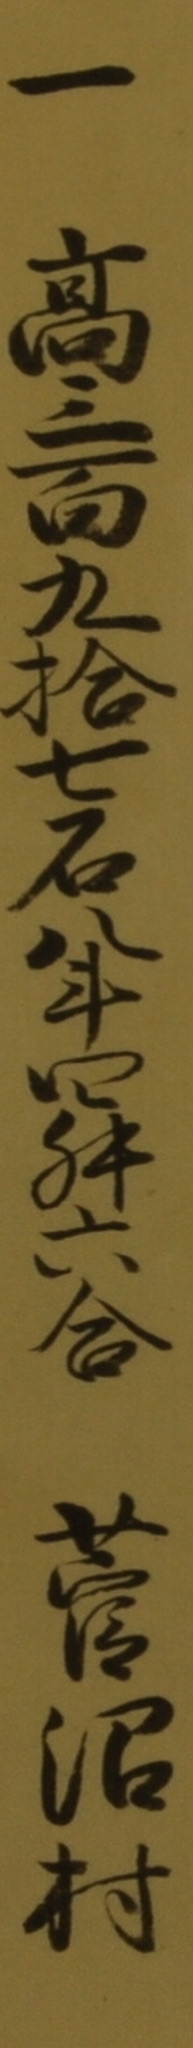一高三百九拾七石八斗四升六合菅沼村

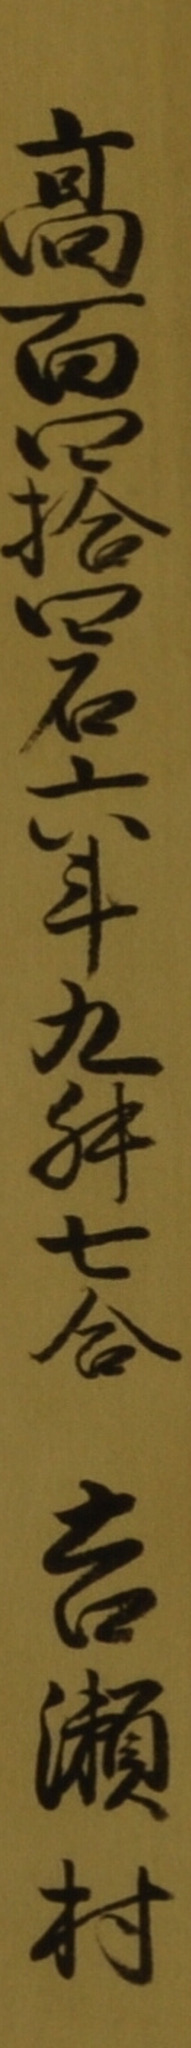一高百四拾四石六斗九升七合吉瀬村
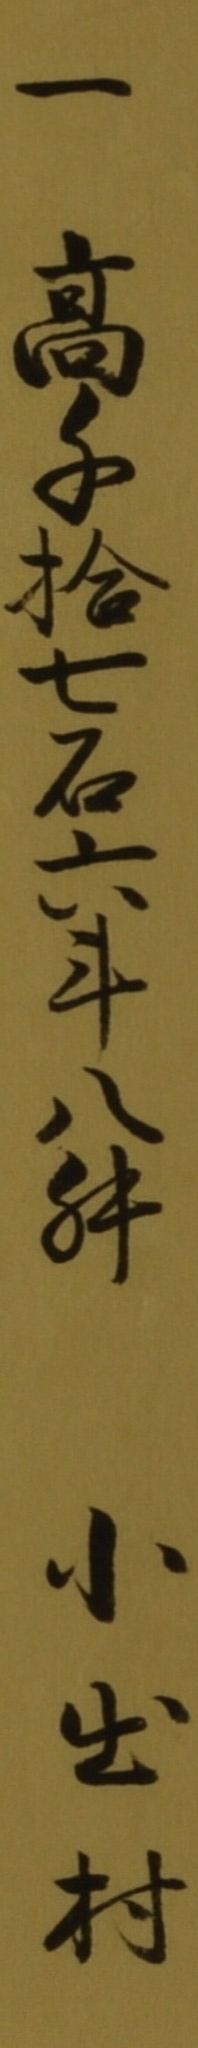一高千拾七石六斗八升小出村
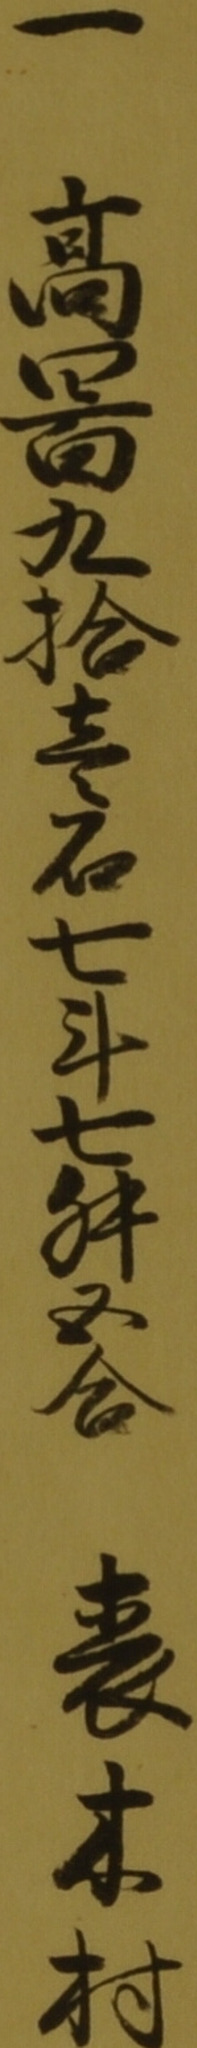一高四百九拾壱石七斗七升五合表木村
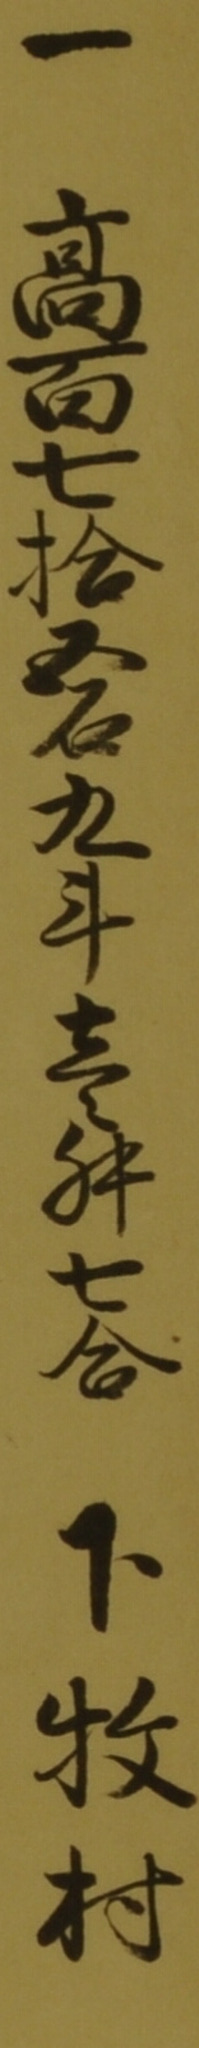一高百七拾五石九斗壱升七合下牧村
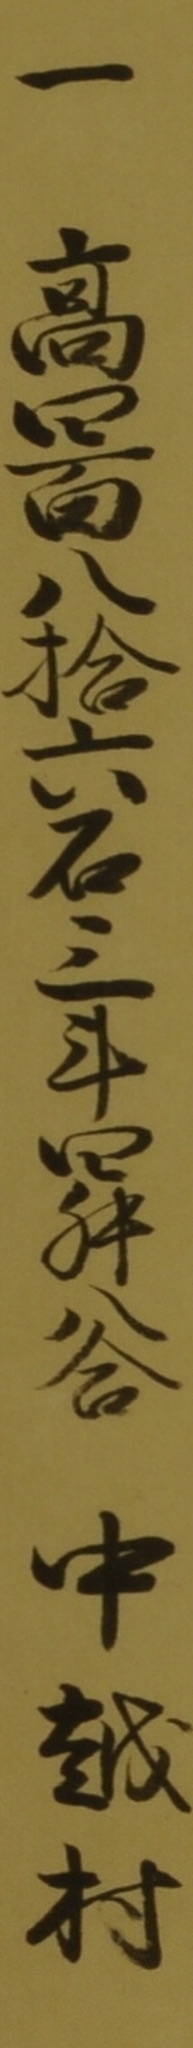一高四百八拾六石三斗四升八合中越村
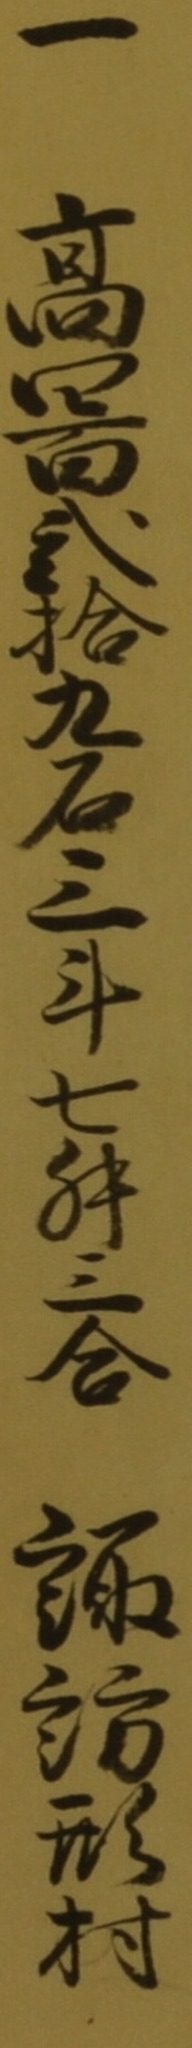一高四百弐拾九石三斗七升三合諏訪形村

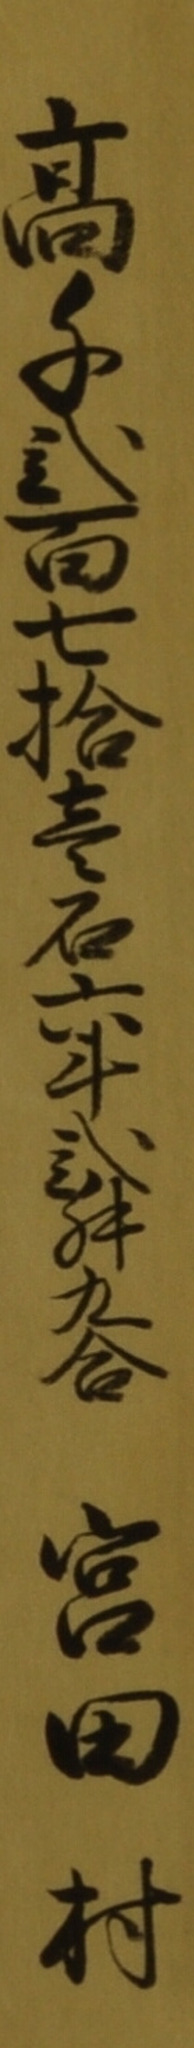一高千弐百七拾壱石六斗弐升九合宮田村
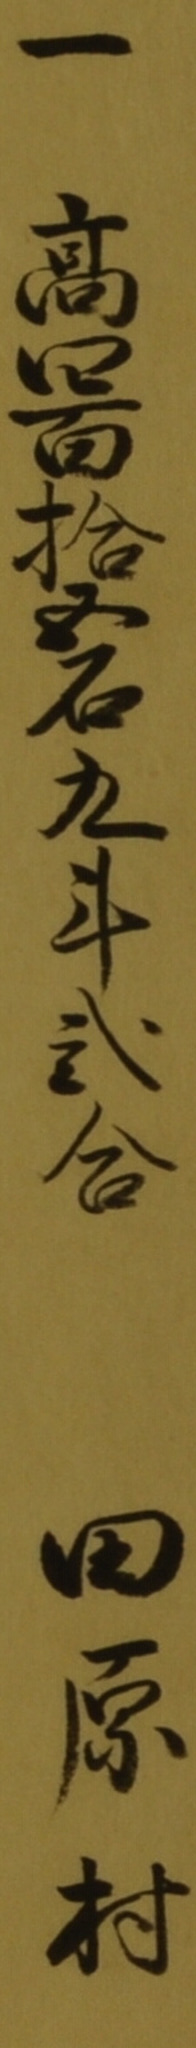一高四百拾五石九斗弐合田原村
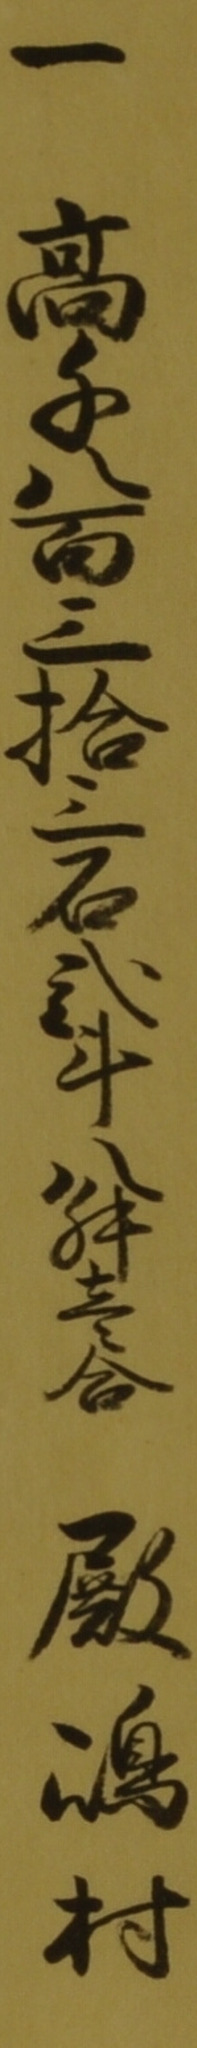一高千八百三拾三石弐斗八升壱合殿島村
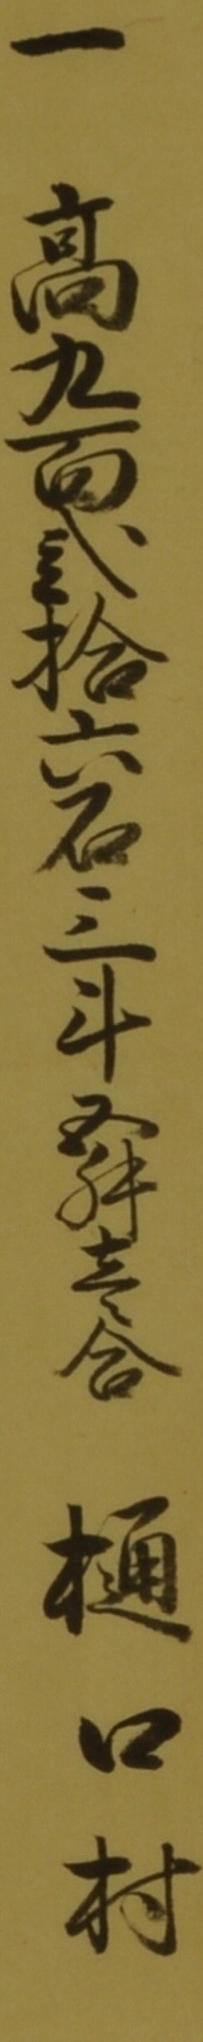一高九百弐拾六石三斗五升壱合樋口村
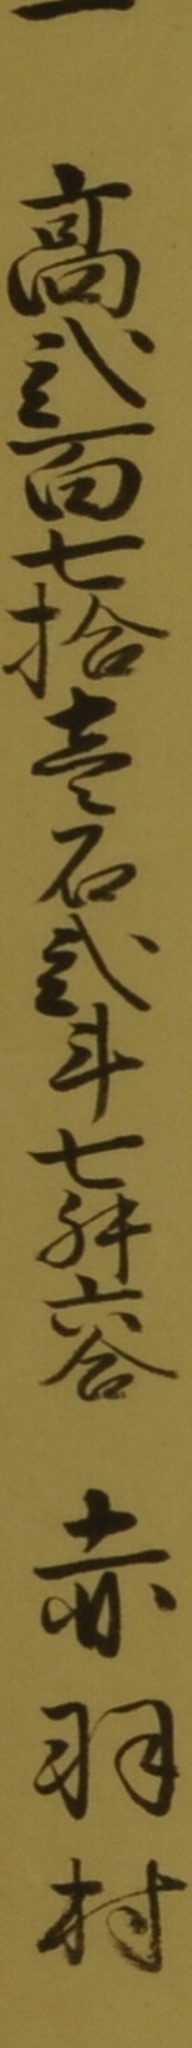一高弐百七拾壱石弐斗七升六合赤羽村
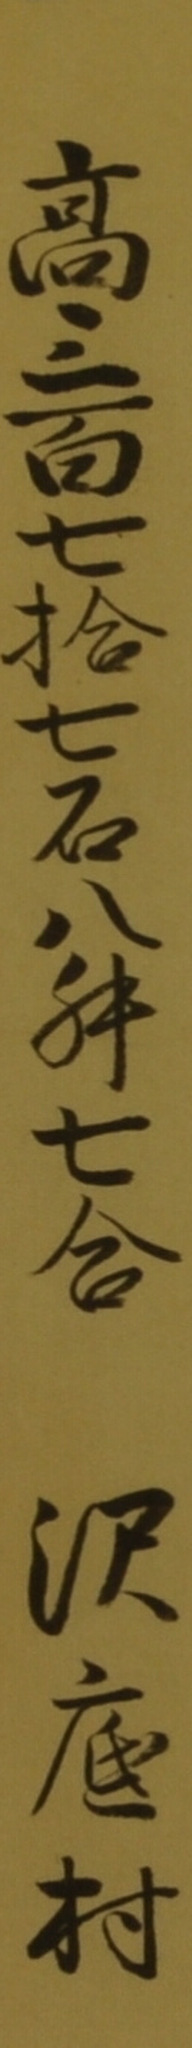一高三百七拾七石八升七合沢底村

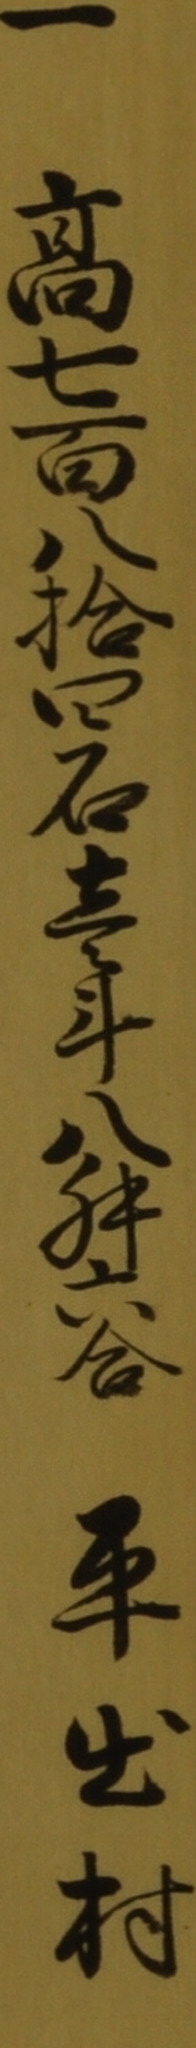一高七百八拾四石壱斗八升六合平出村
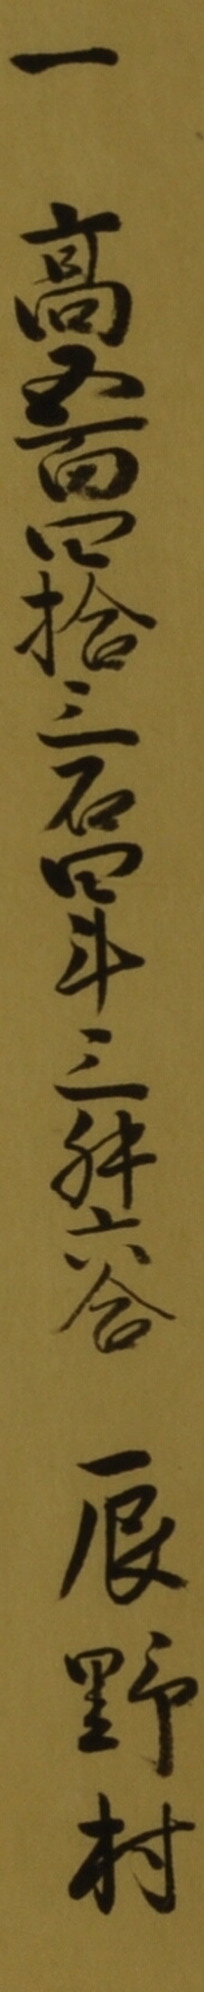一高五百四拾三石四斗三升六合辰野村
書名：信濃国伊那郡筑摩郡高遠領知郷村高辻帳
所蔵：伊那市立高遠町図書館・合同会社AMANE
